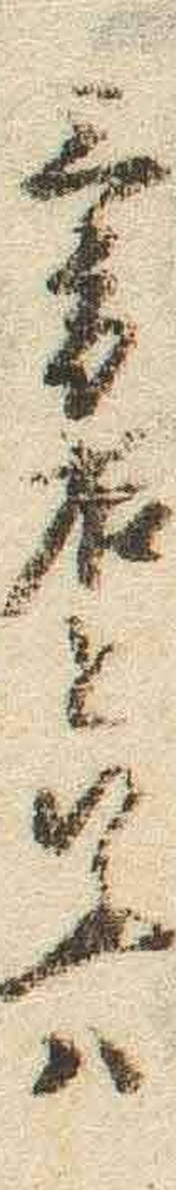三方店といふは
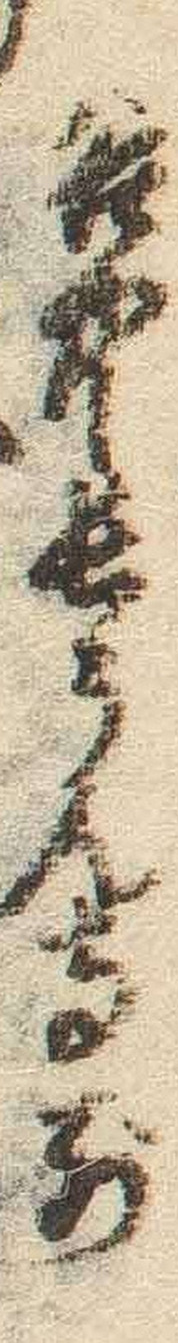谷中長うん寺前
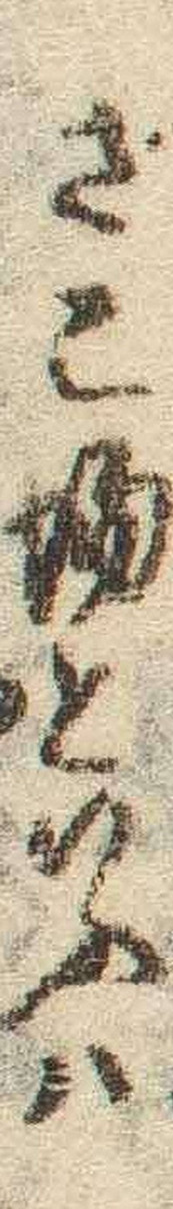ざこ場といふは
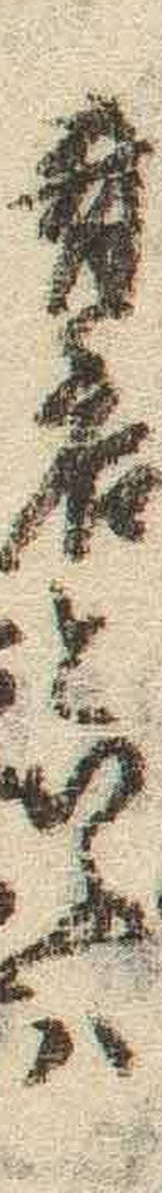肴店といふは
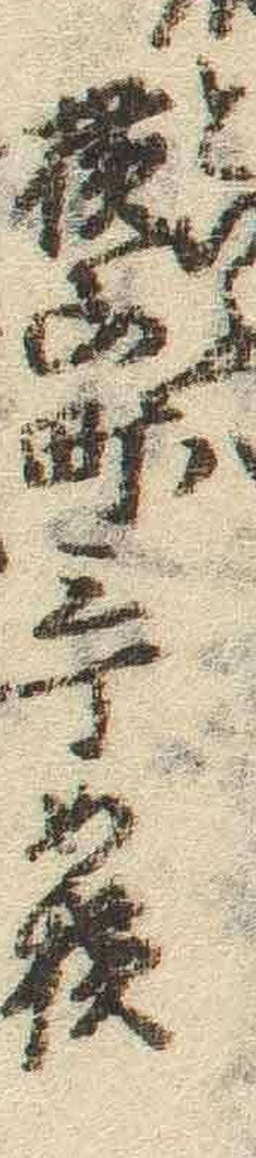横山町三丁め横
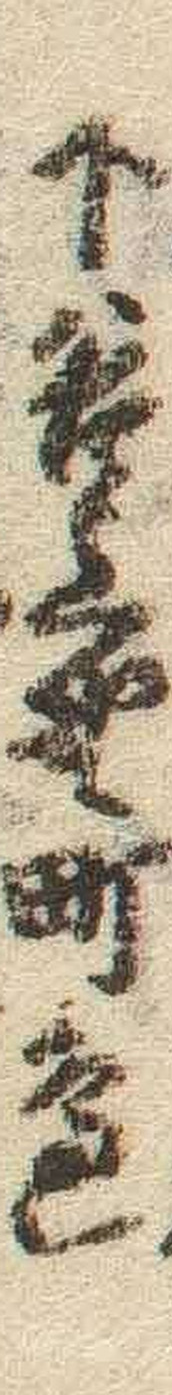下谷上野町辺
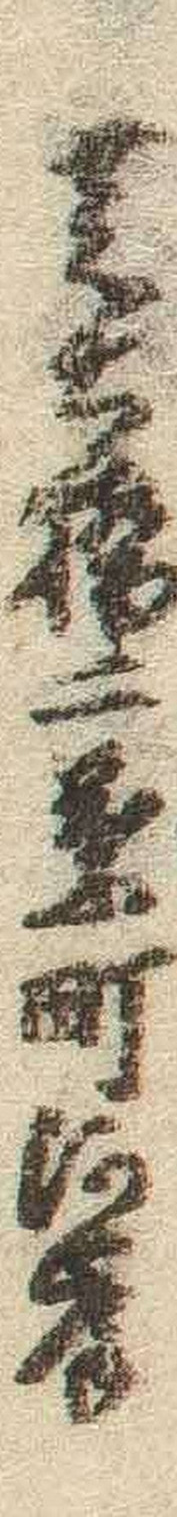芝土橋二葉町河岸

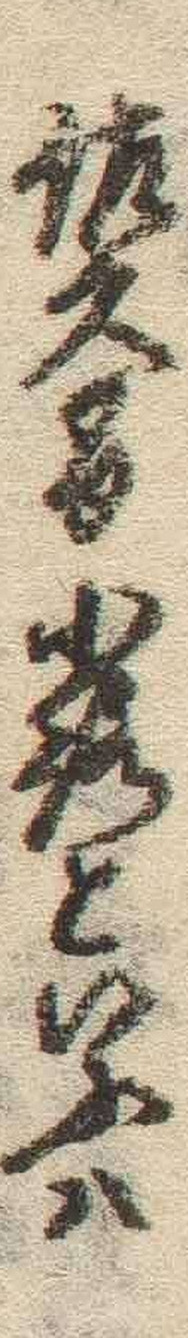佐久間小路といふは
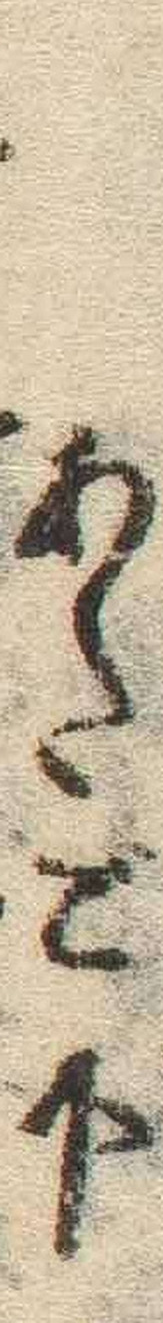あたご下
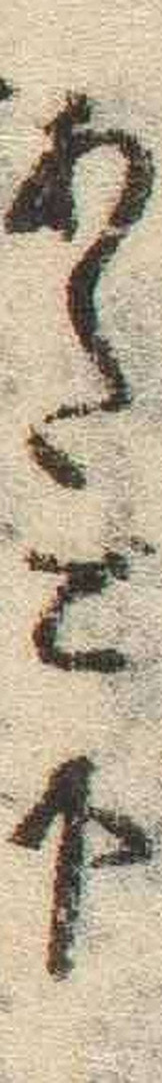あたご下
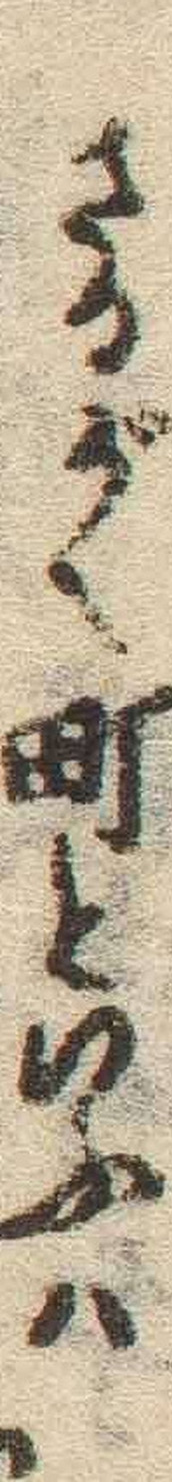さるがく町といふは
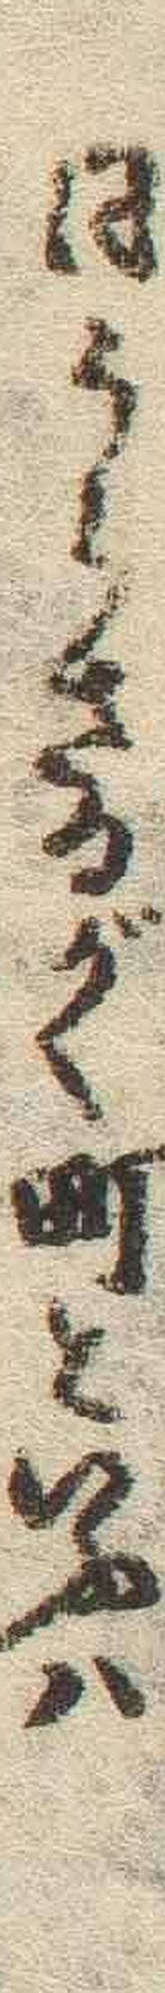同うらさるがく町といふは
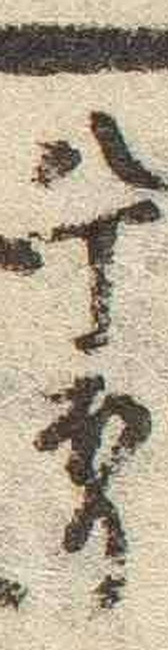八丁ほり
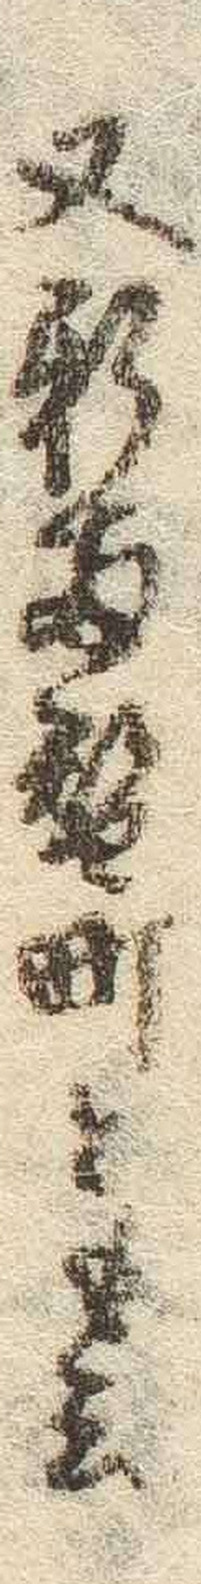又新両替町とも云
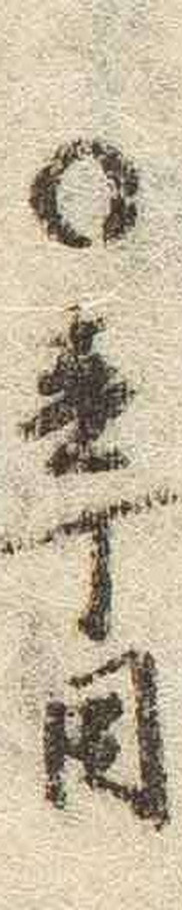○壱丁目
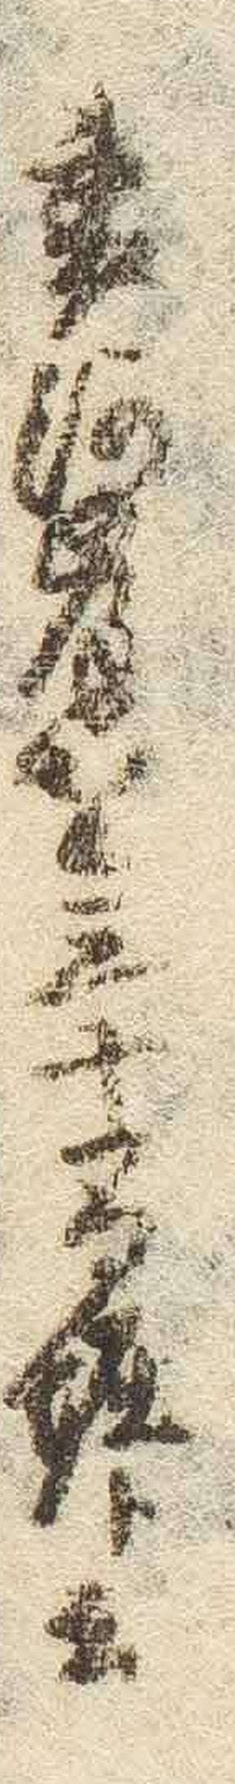裏河岸を三十間堀ト云
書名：江戸町独案内
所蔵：東京学芸大学附属図書館 国文学研究資料館
